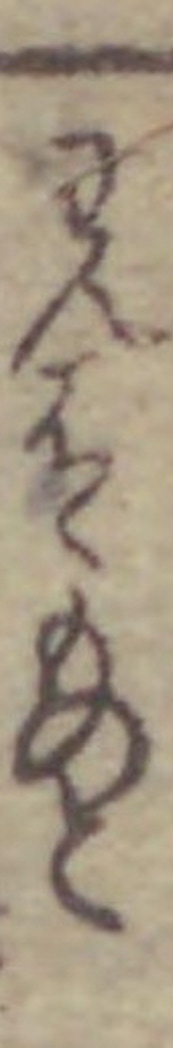わんはくものと
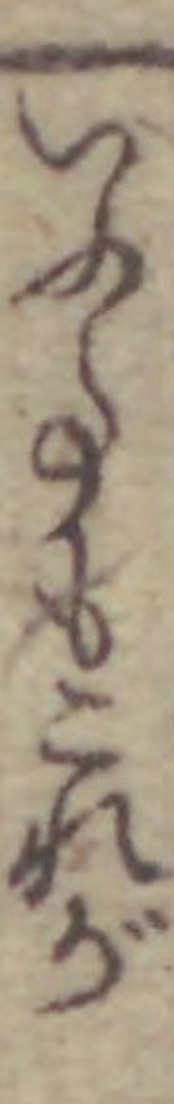いふ事もこれが
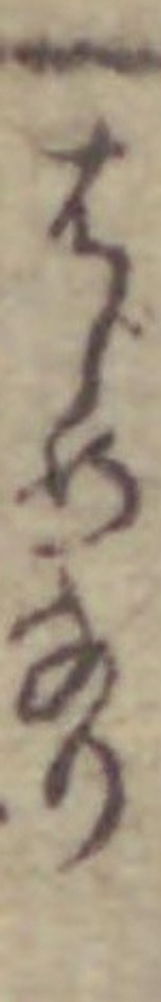はじめなり
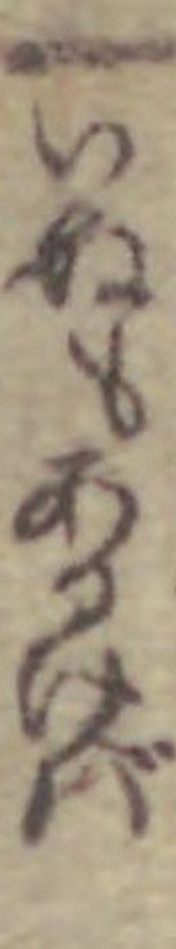いぬもあるけば
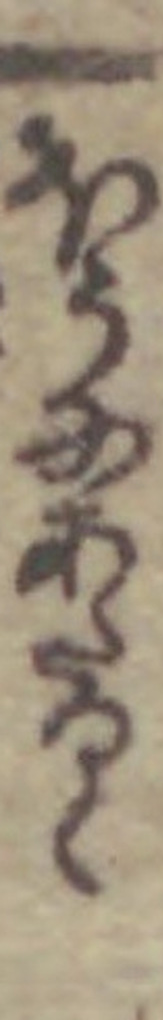ほうにあたると
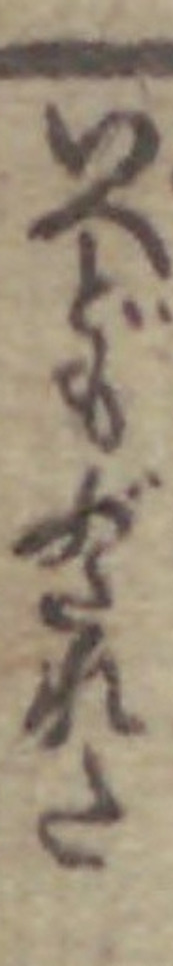いへどもぶたれた
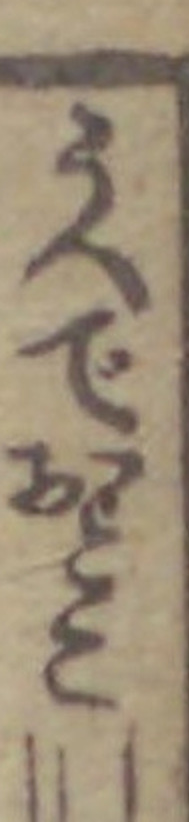うへでおとこ
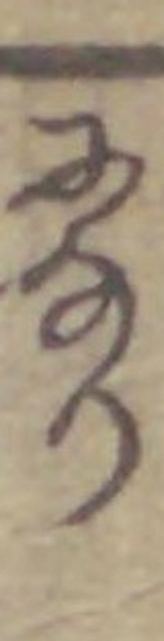になり
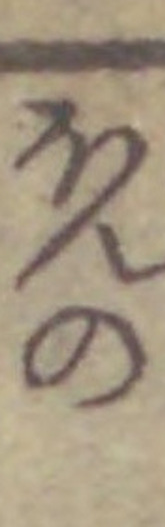ほんの
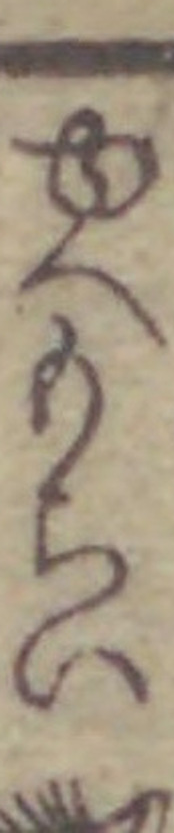ゆへもちい
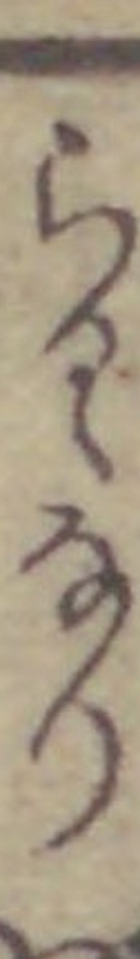らるゝなり
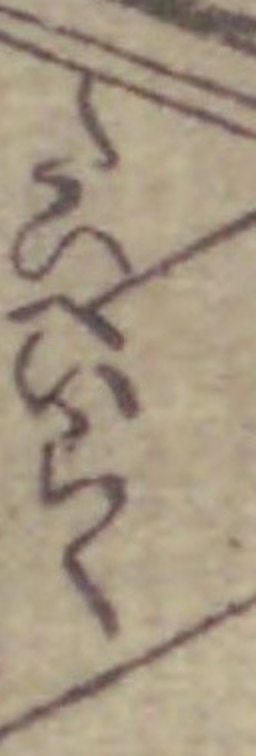たいへいらく
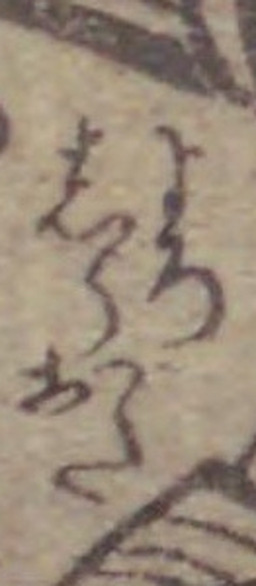しくおた
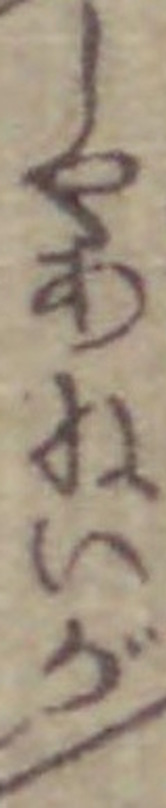しやあねいが
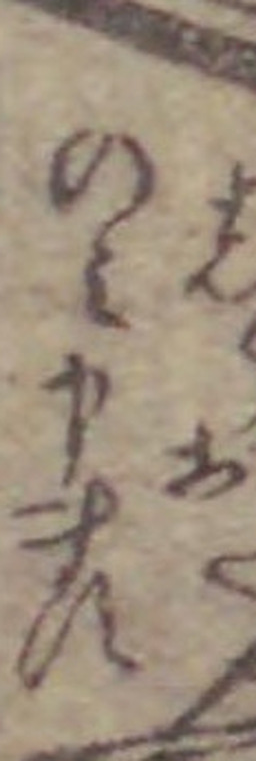のみ申ます
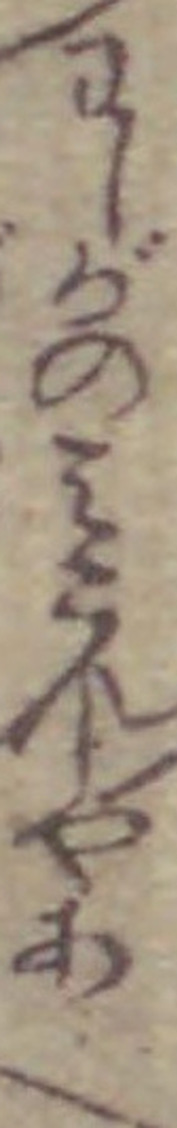わしがのみこんしやあ
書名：狆の嫁入 2巻
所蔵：国立国会図書館 National Diet Library, JAPAN
